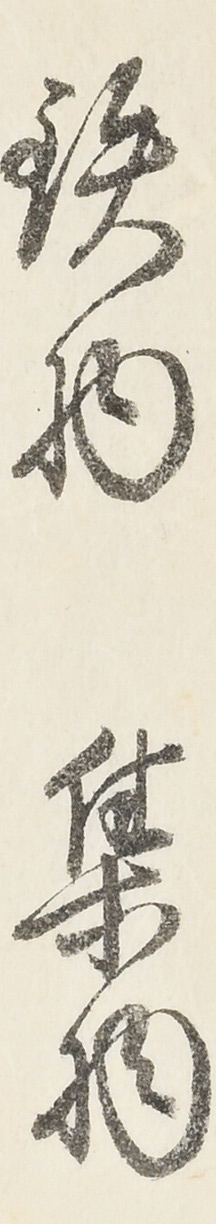鉄物集物
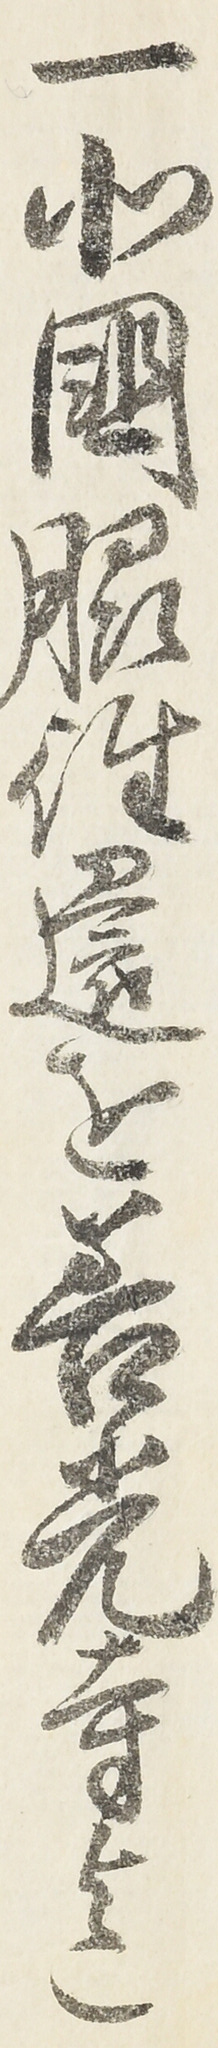一北国脇往還を善光寺迄
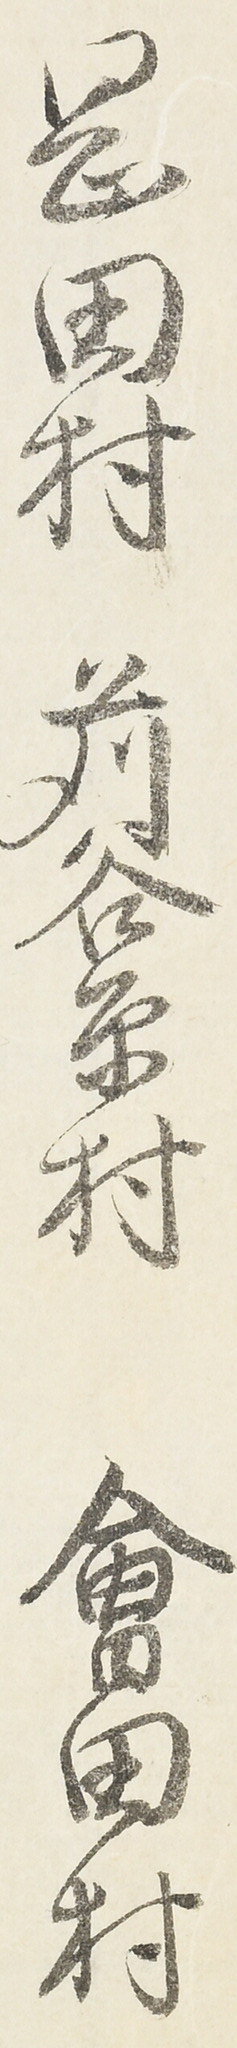岡田村刈谷草村会田村
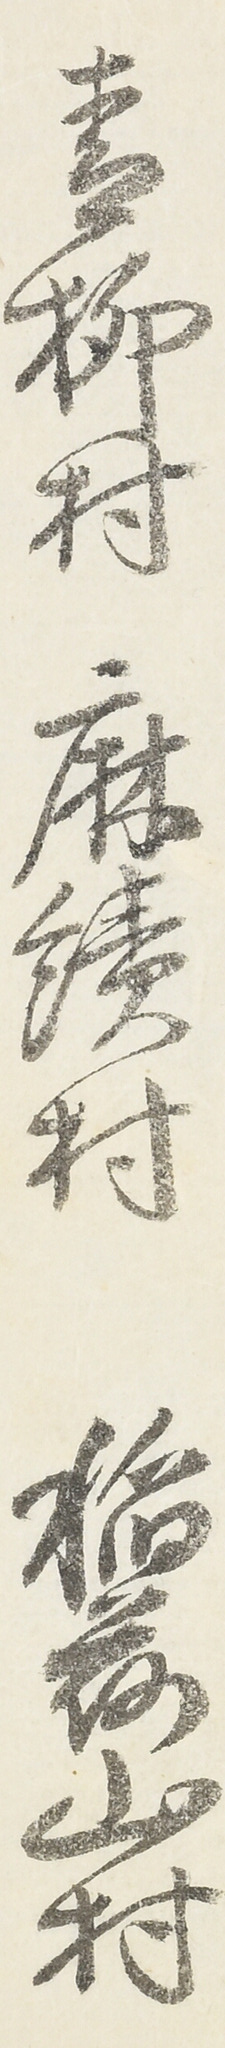青柳村麻績村稲荷山村
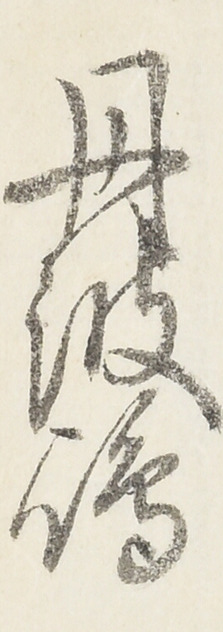丹波嶋

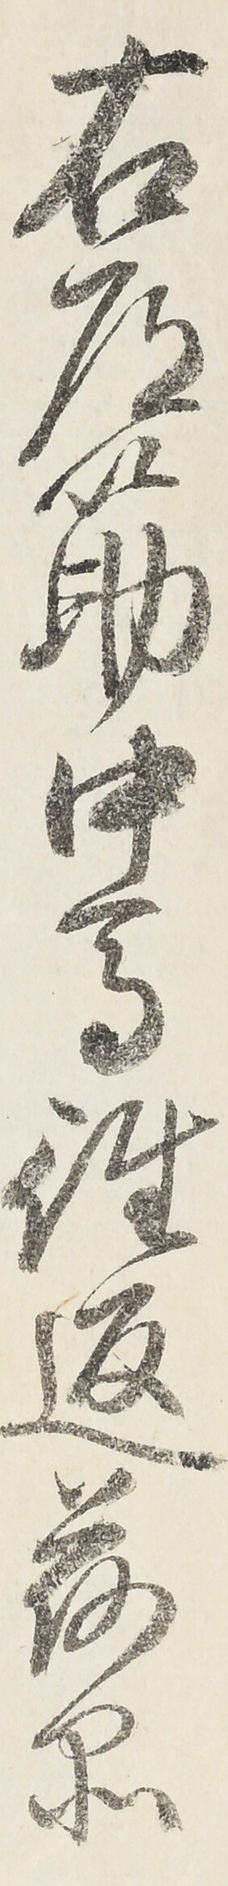右道筋中馬往返荷品
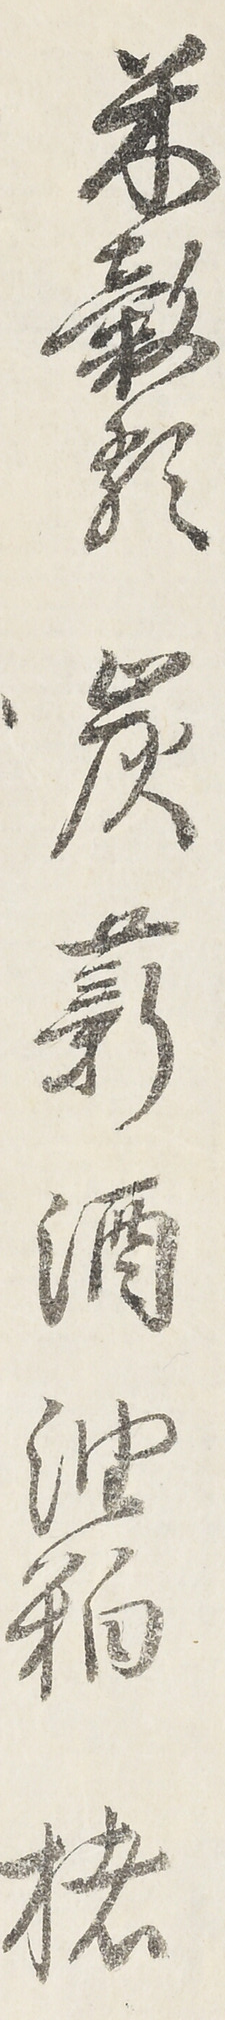米穀類炭薪酒油粕楮
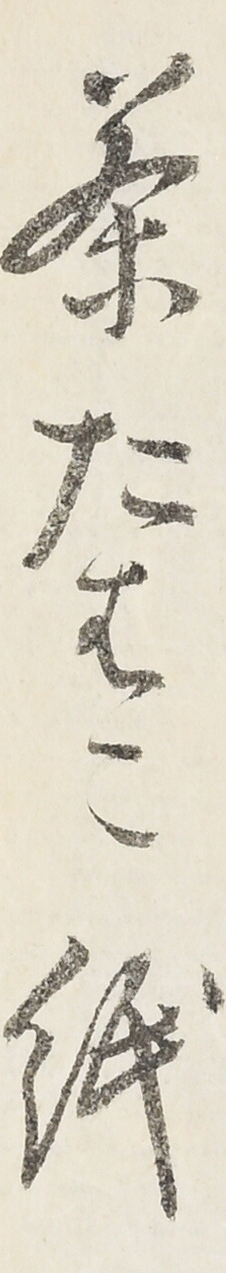茶たはこ紙
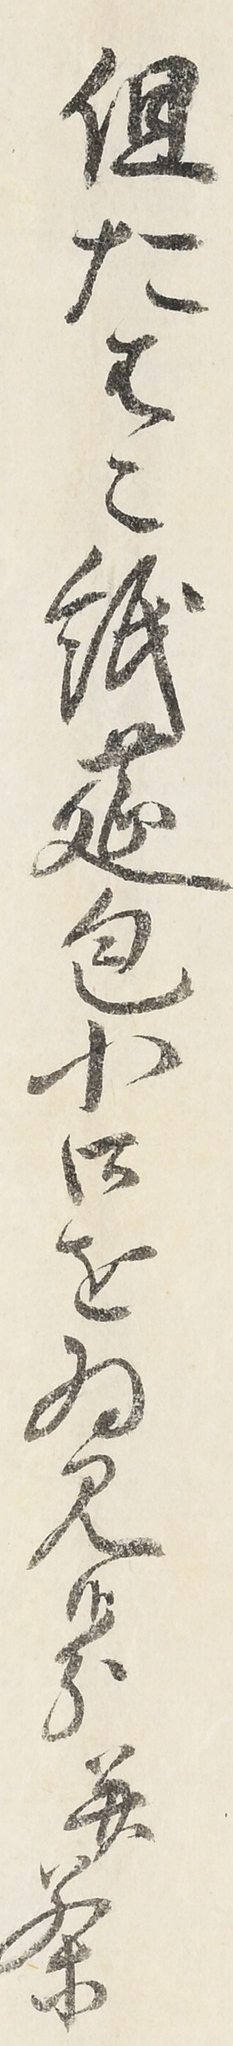但たはこ紙莚包小口を為見候分并茶
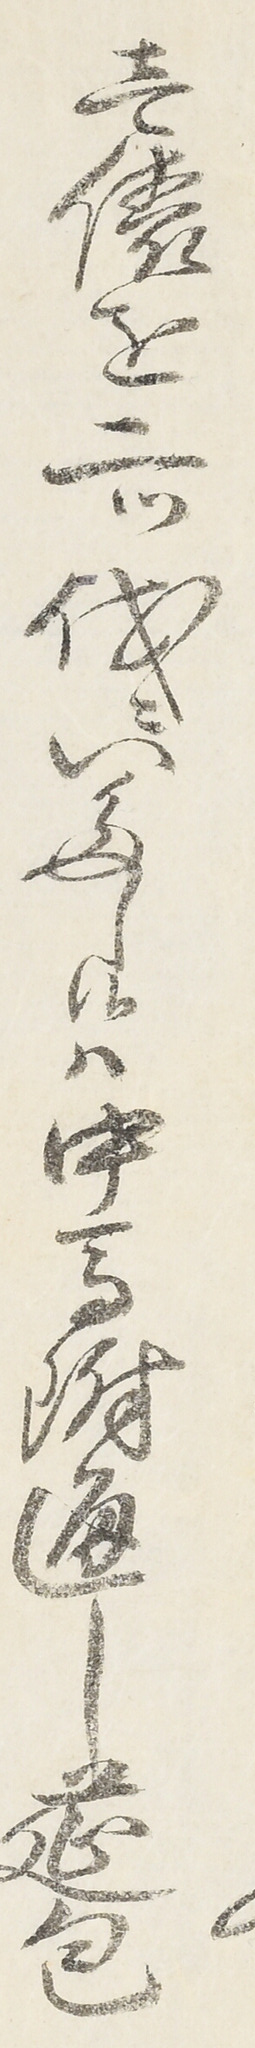壱俵を二ツ伐ニいたし候ハ中馬附通し莚包
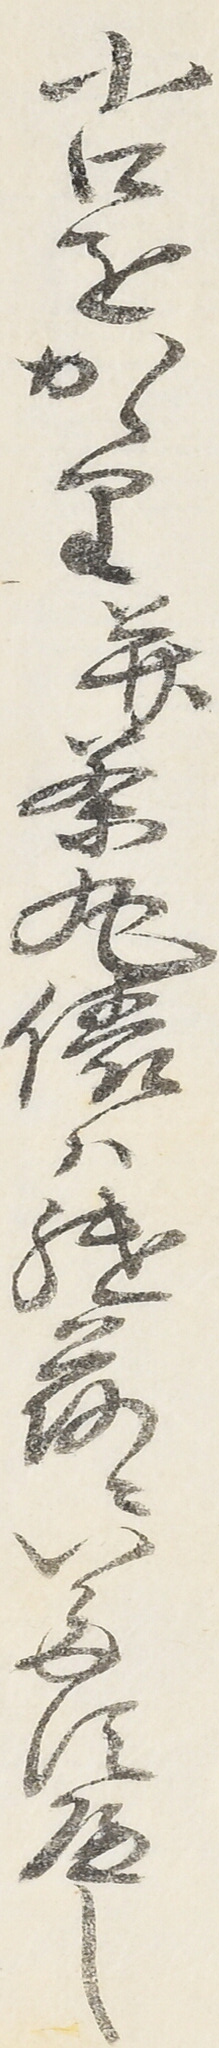小口をかゝり并茶九俵ハ継荷ニいたすへし
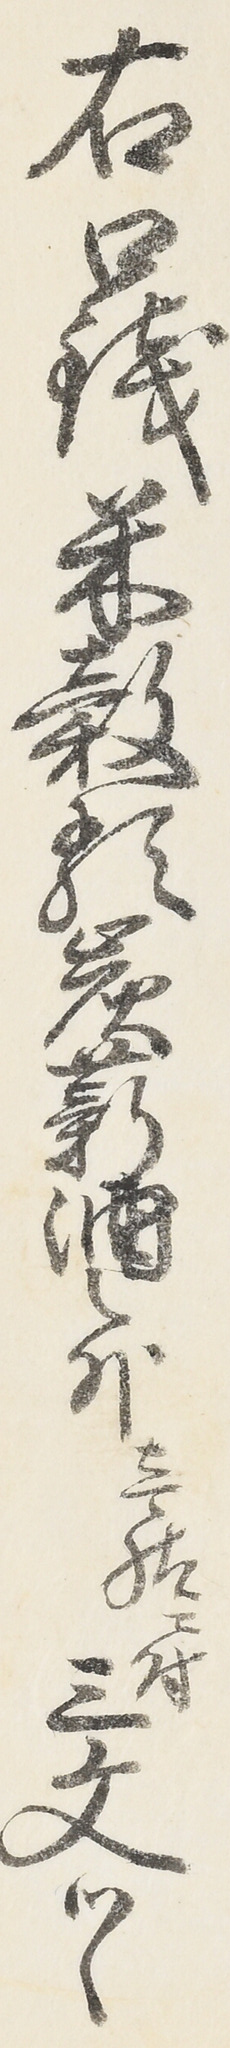右口銭米穀類炭薪酒之外壱駄ニ付三文ツヽ
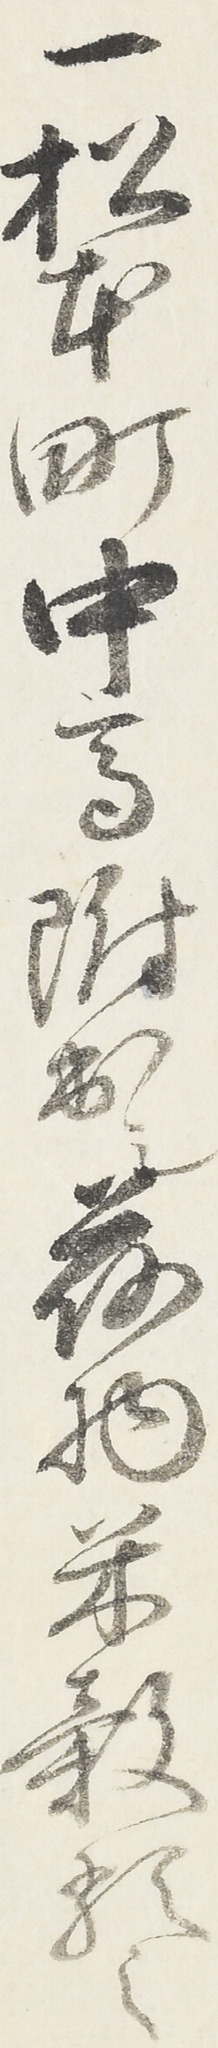一松本町中馬附出シ荷物米穀類之
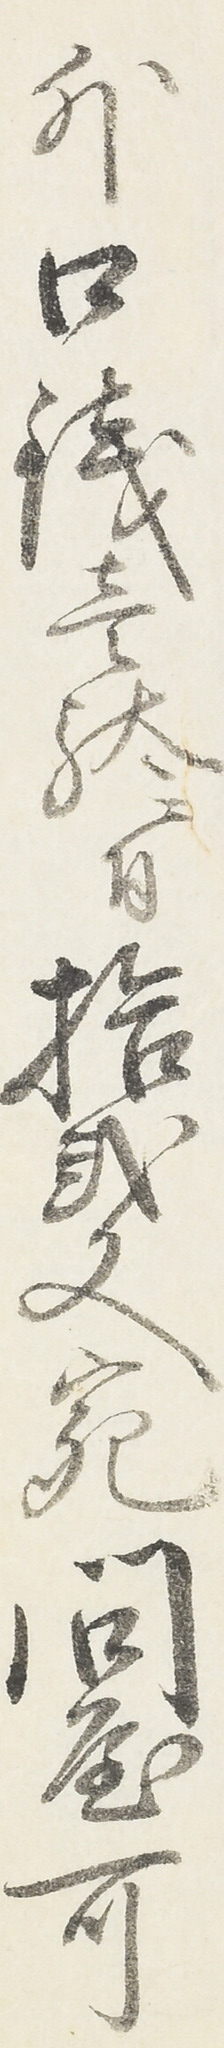外口銭壱駄ニ付拾弐文宛問屋可
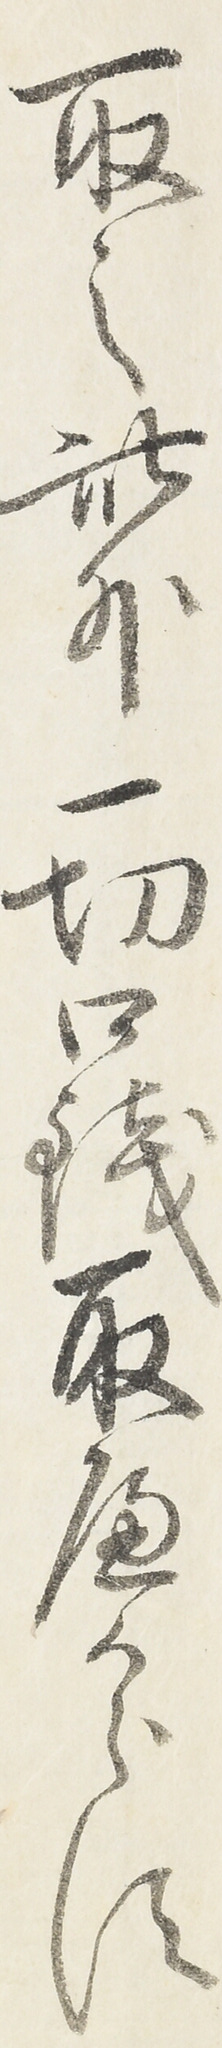取之此外一切口銭取へからす
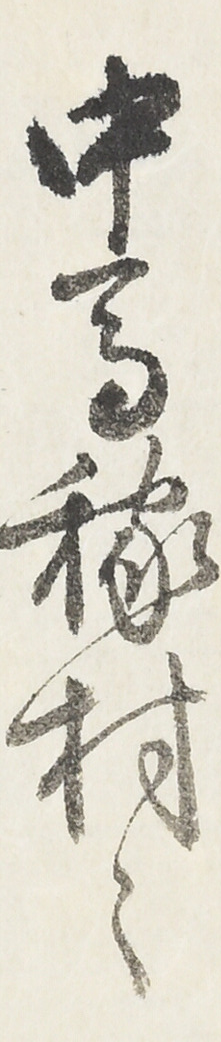中馬稼村々
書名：中馬御裁許帳面
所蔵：伊那市立高遠町図書館・合同会社AMANE
